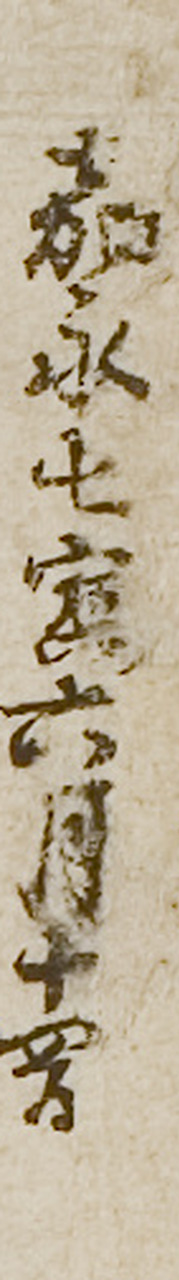嘉永七寅ノ六月十四日
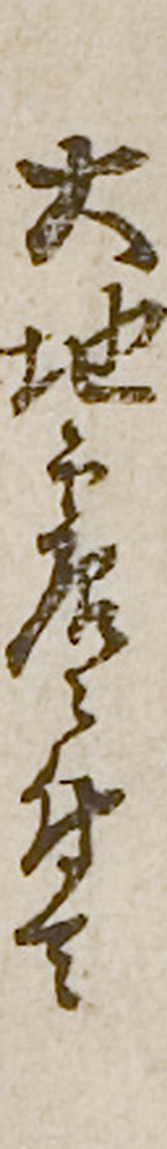大地震に付て
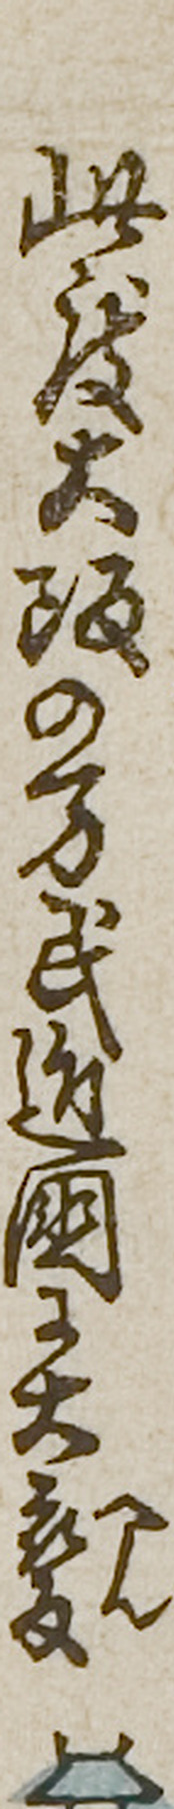此度大阪の万民近国に大変
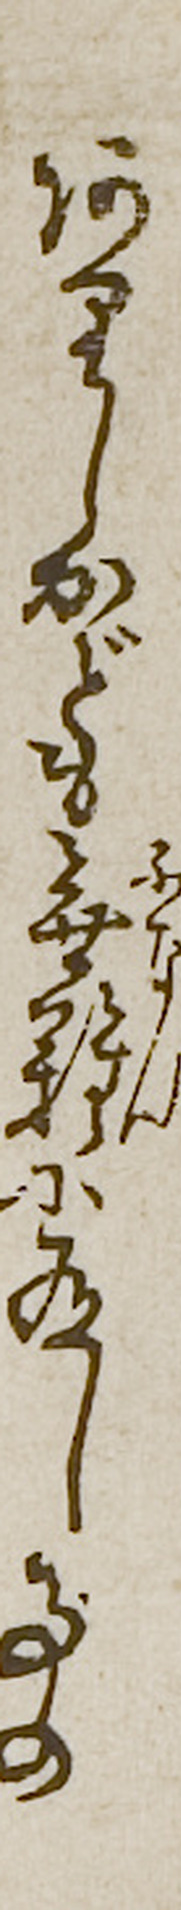ありしかども無難に有し事の
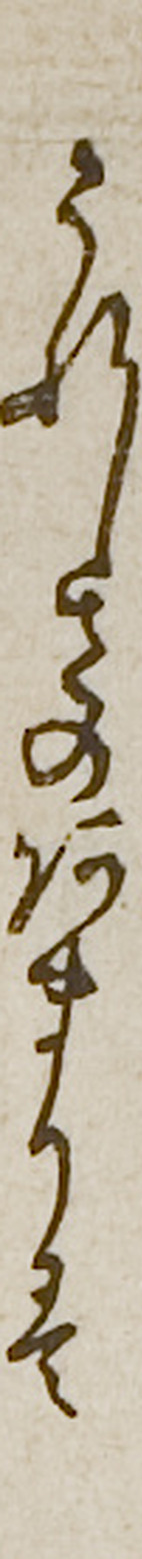うれしさのあまりにて
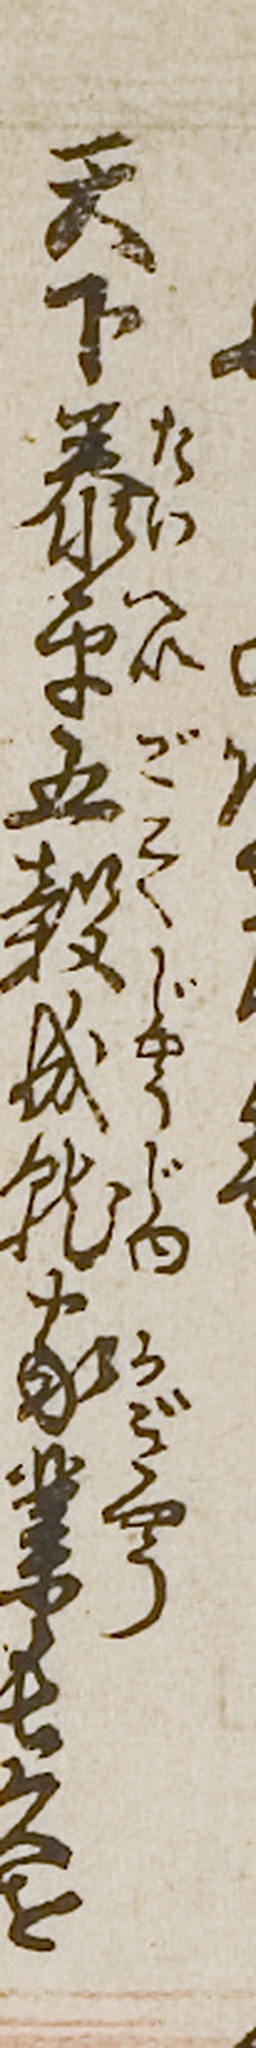天下泰平五穀成就家業長久を
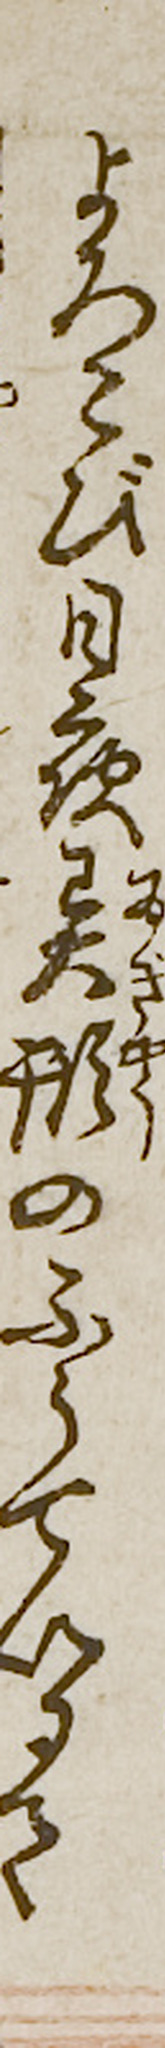よろこび日夜異形のふうていにて
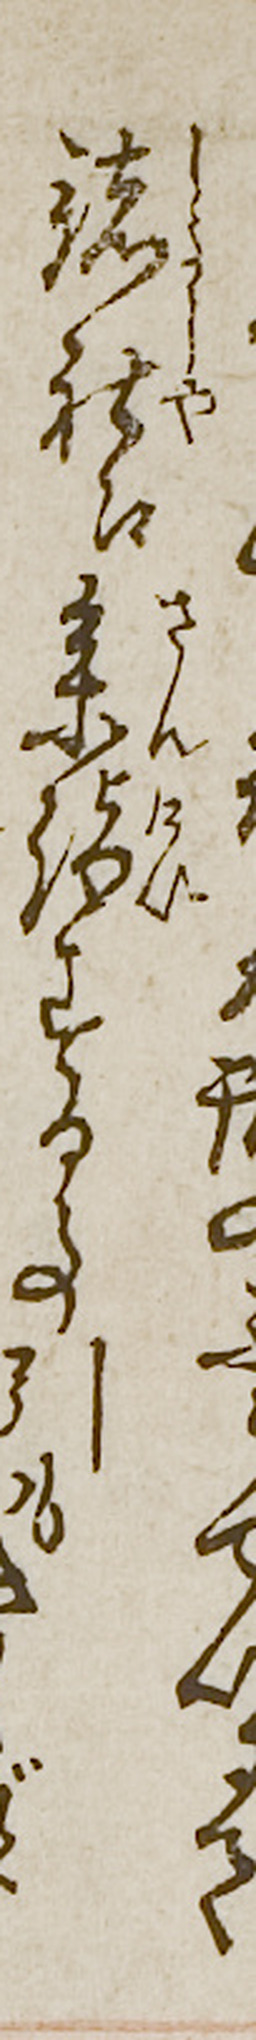諸社え参詣する事引きもきらず
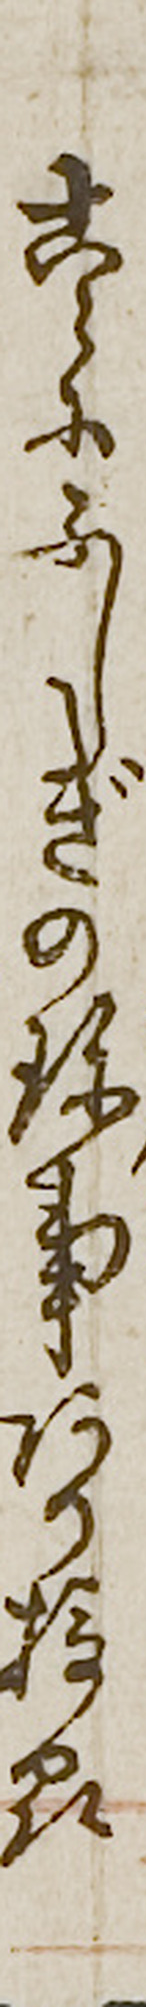こゝにふしぎの珍事あり摂州
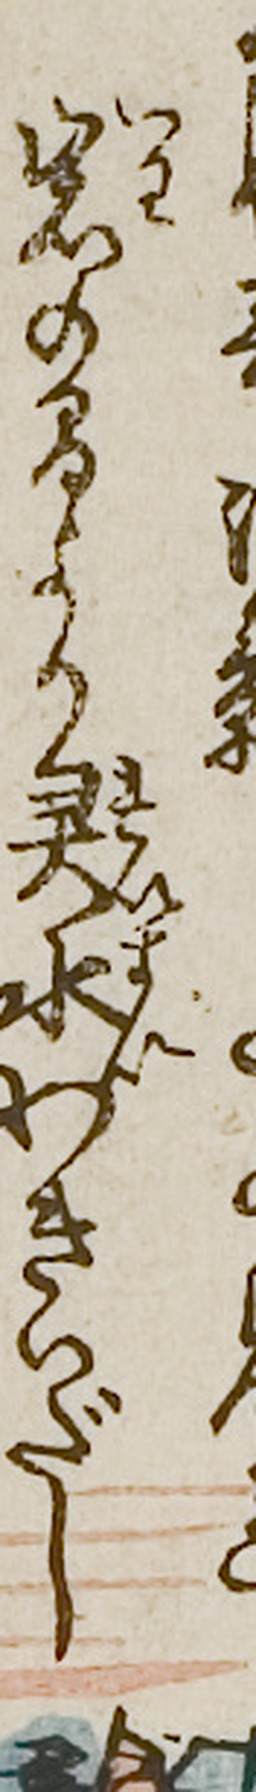岩の間より霊水わきいだし
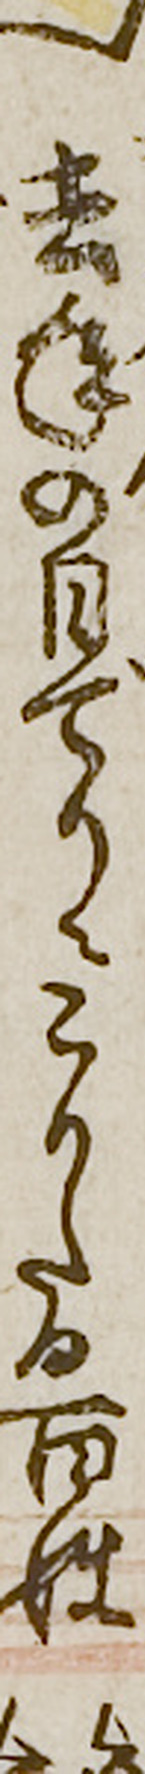去年の日でりにこりたる百姓
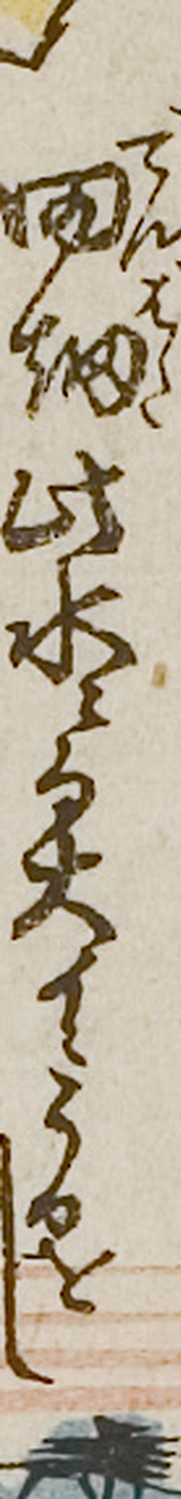田畑此水にて大いにうるをし
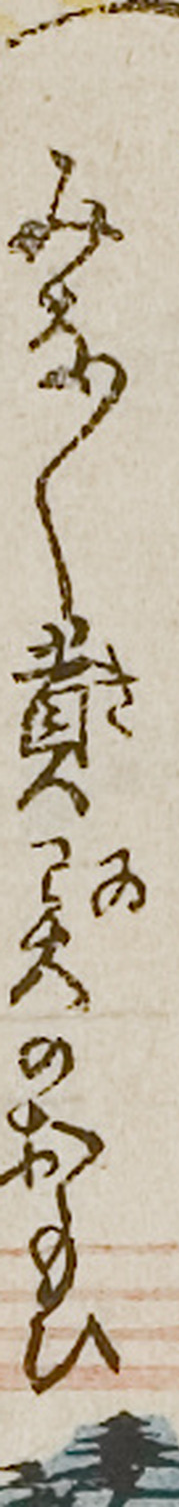みな〳〵貴異のおもひ
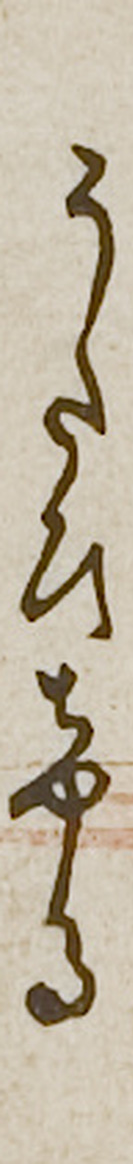うたひける
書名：嘉永七寅六月十四日大地震に附て
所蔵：東京大学総合図書館 General Library in the University of Tokyo, JAPAN
